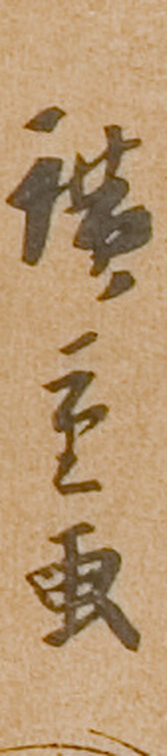廣重画
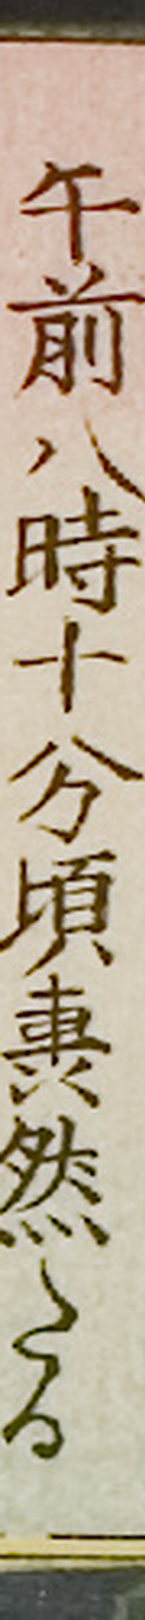午前八時十分頃轟然たる
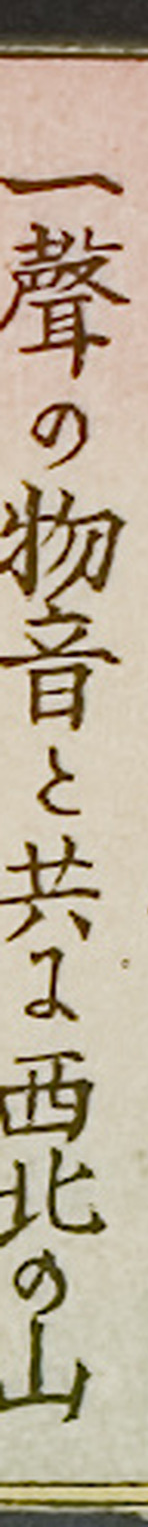一声の物音と共に西北の山
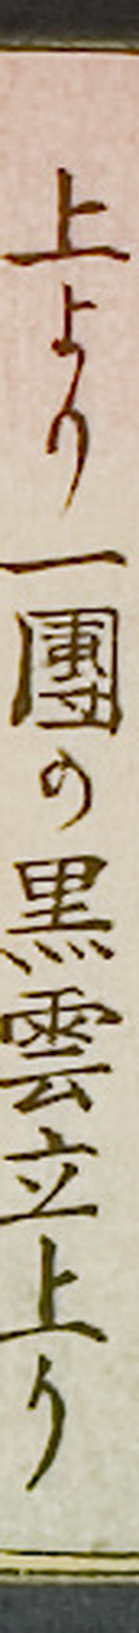上より一団の黒雲立上り
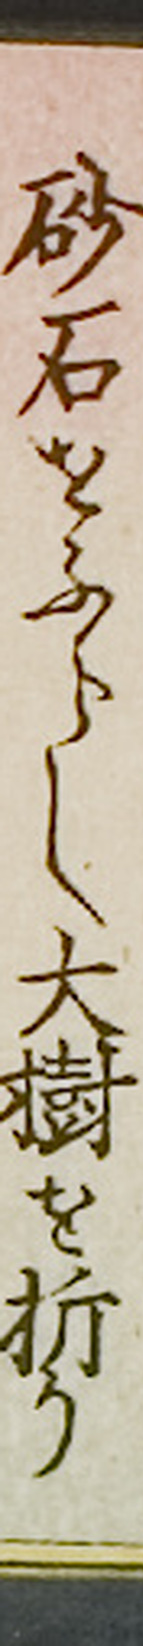砂石をふらし大樹を折り
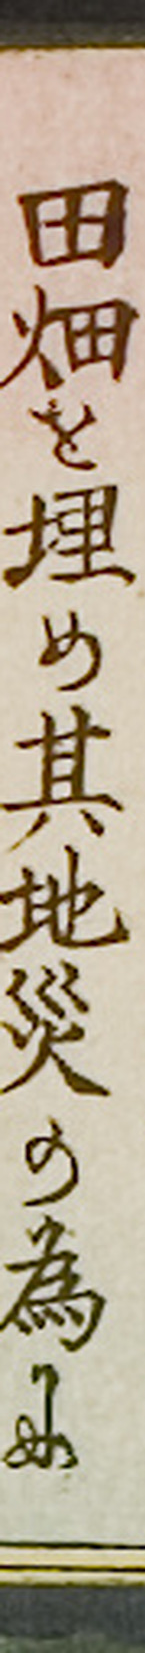田畑を埋め其地災の為に
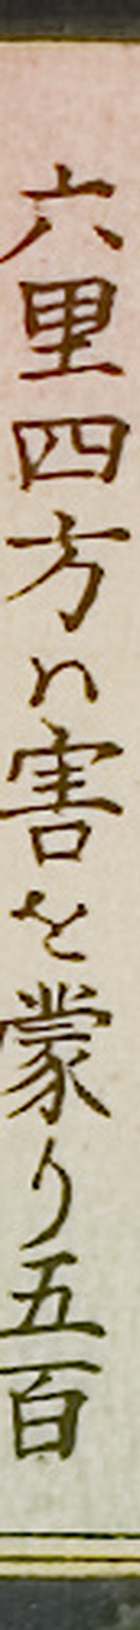六里四方は害を蒙り五百
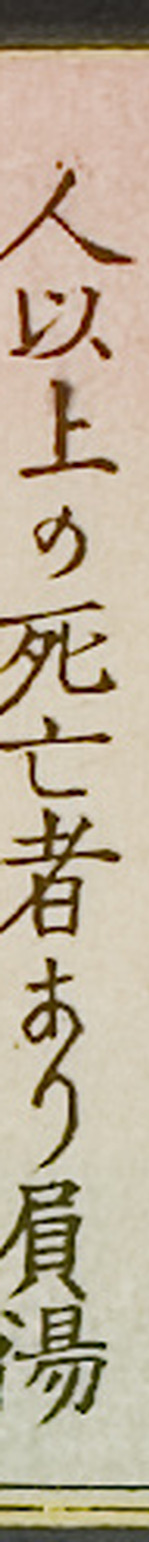人以上の死亡者あり負傷
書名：磐梯山噴火之図
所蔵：東京大学総合図書館 General Library in the University of Tokyo, JAPAN
